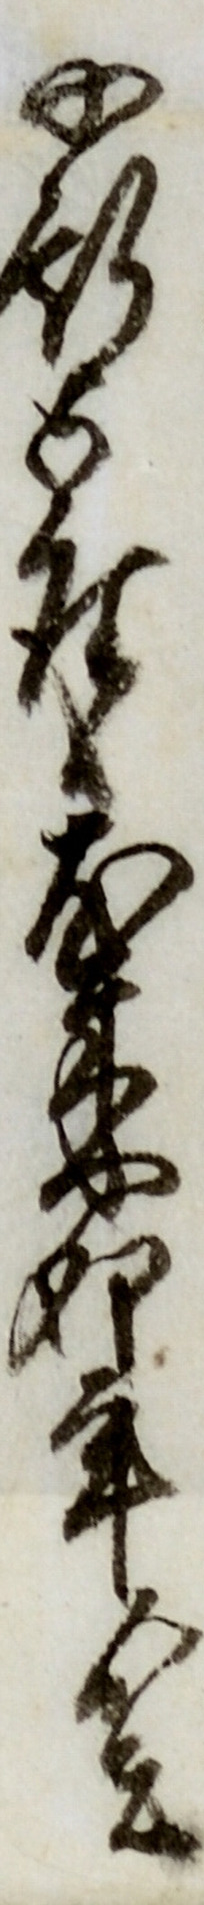如斯御座候尤来卯年よりは
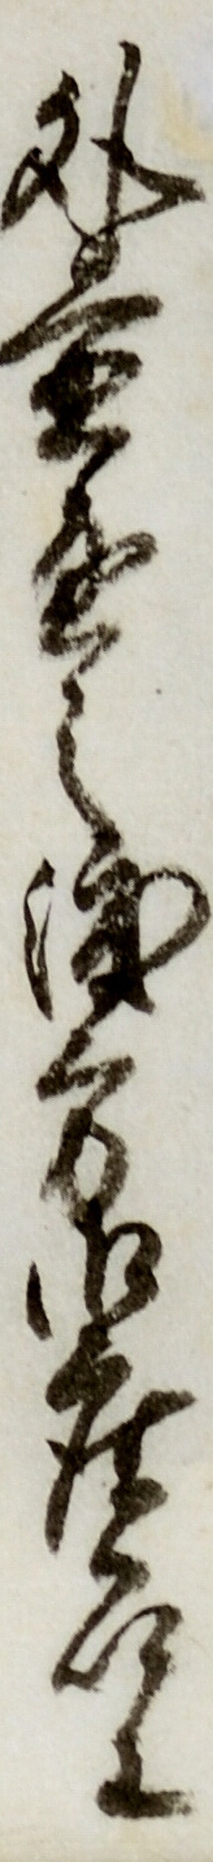外並通之渡方御座候以上
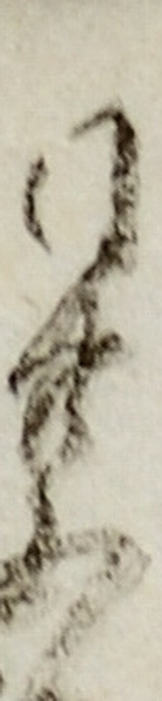同廿五日
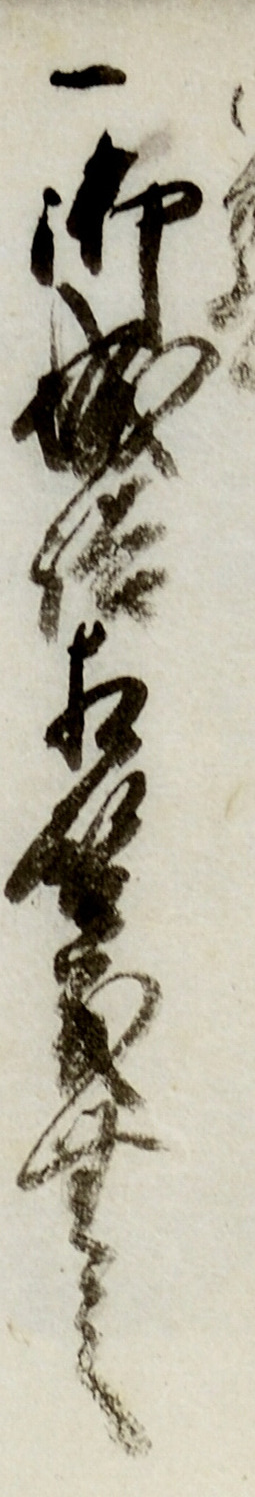一御城詰相替義無之
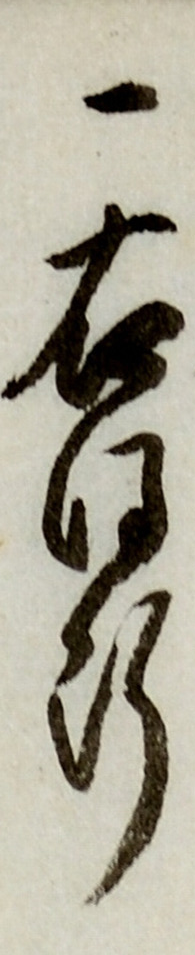一右同断
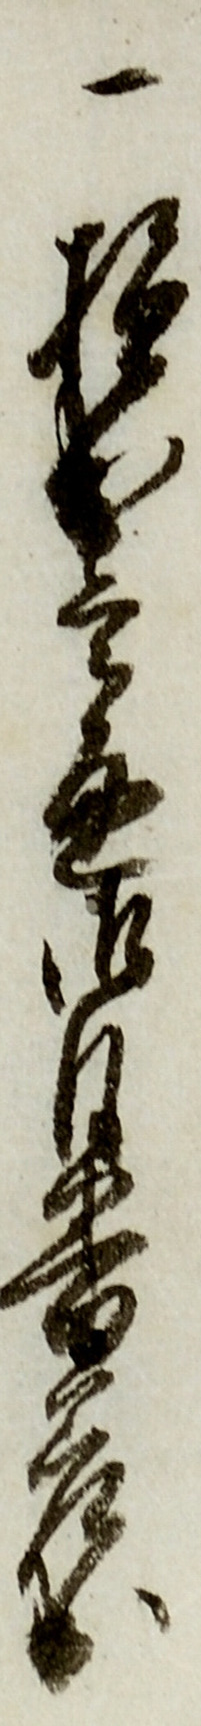一指出壱通御月番差出
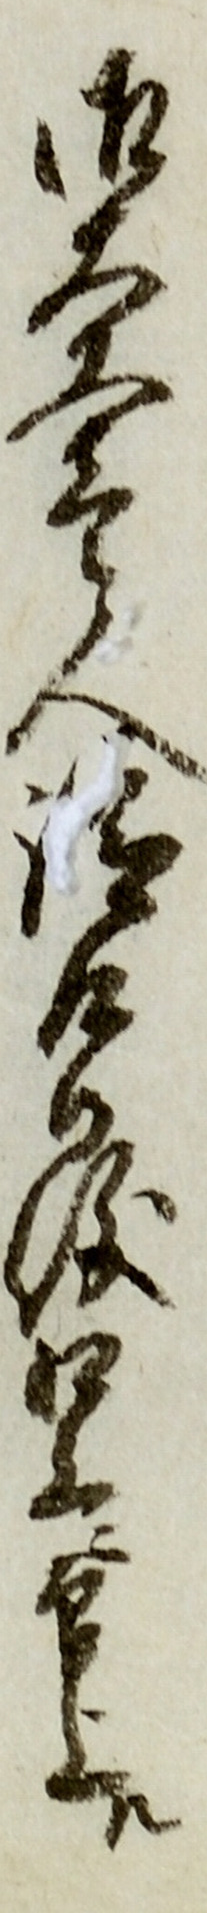御大工壱人請取候儀口上に印上る
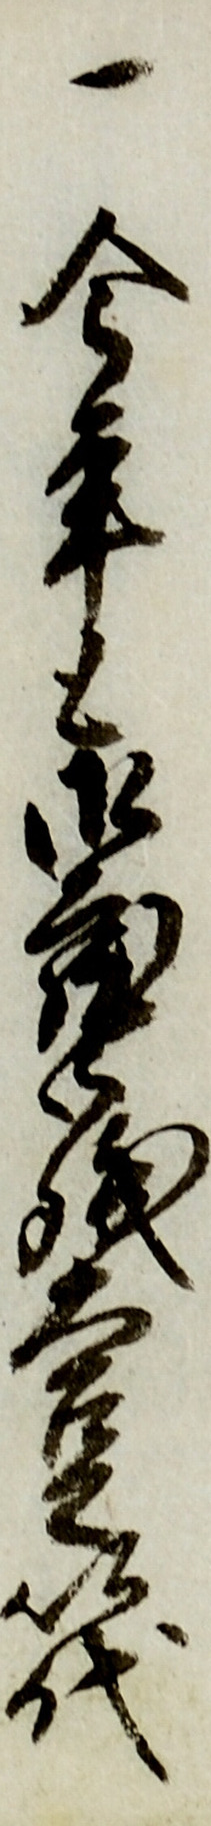一今年も御蔵御残大豆以代
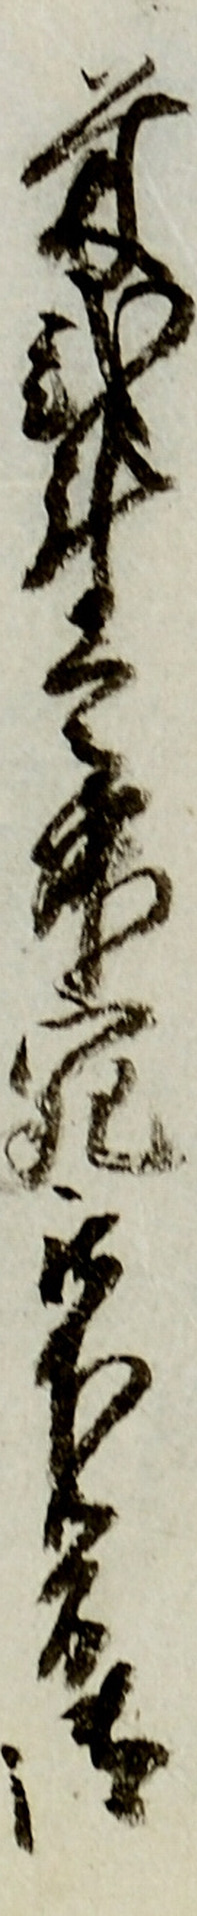米弐斗壱升宛被下候間御
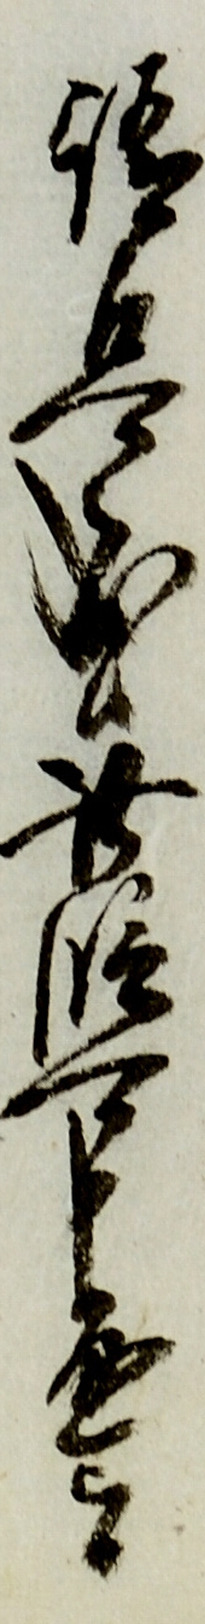請取可被成候此段可申通旨
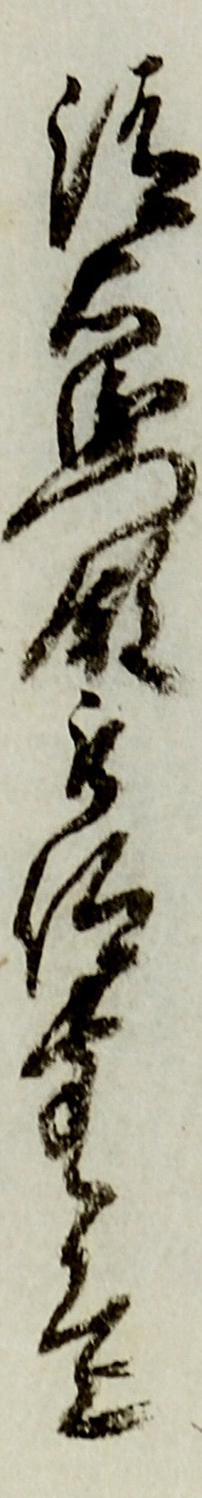清右衛門殿被仰聞候以上
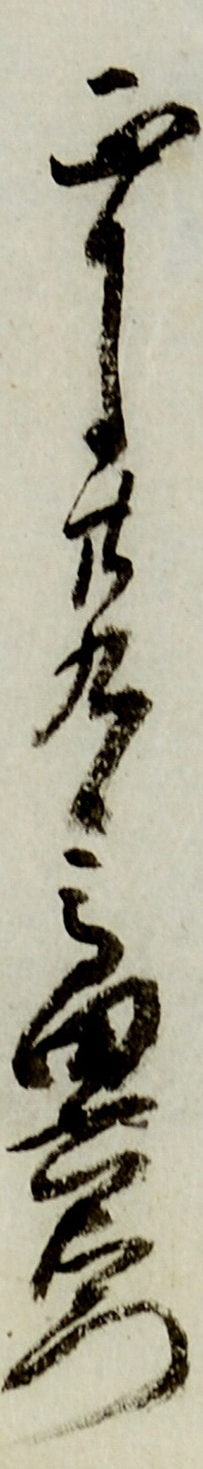正月廿九日高田六右衛門
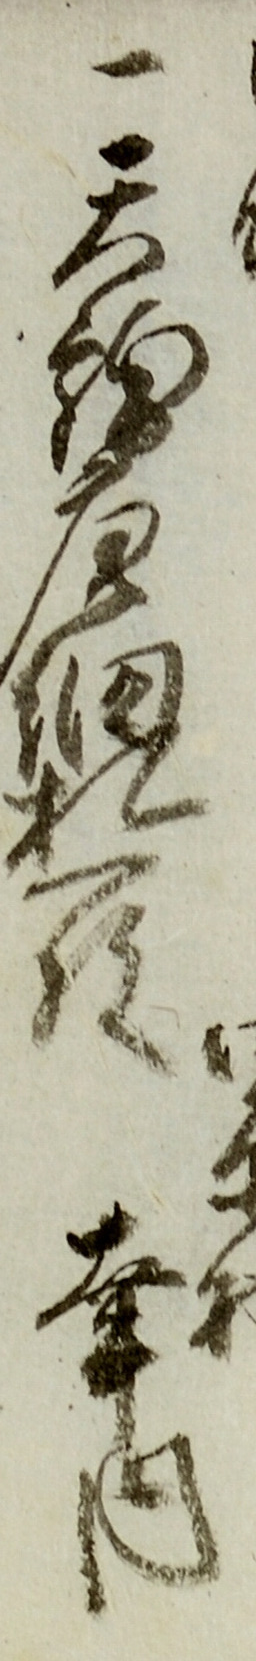一天龍唐網札一枚幸内
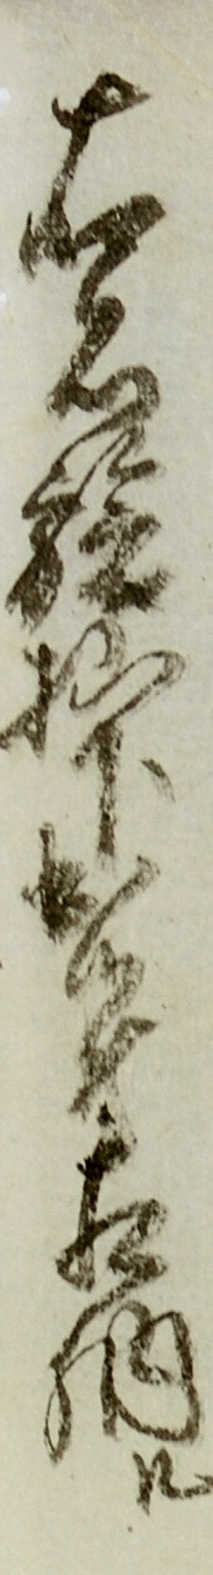右者旅杣挊出候付相納ル
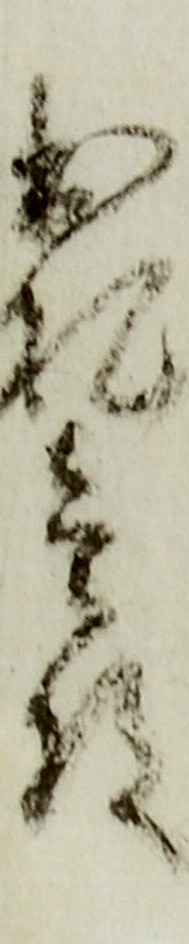出札壱枚
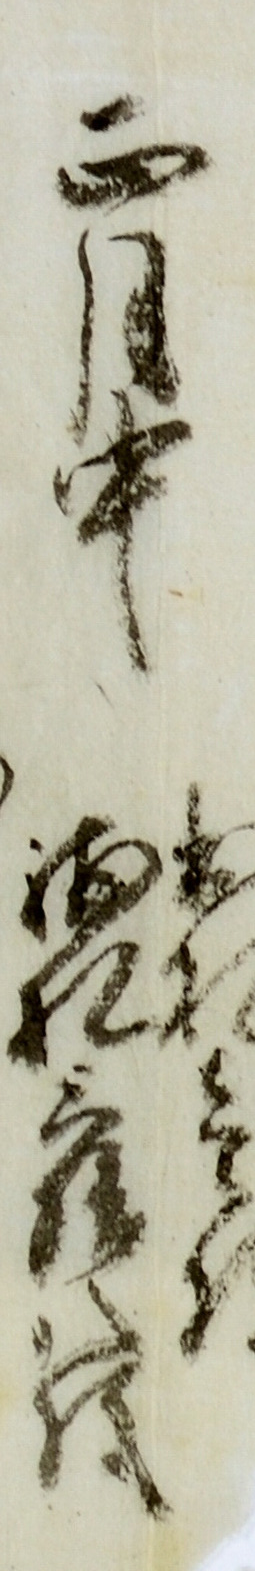正月中残札三拾八枚
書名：諸事御用留帳
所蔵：伊那市立高遠町図書館・合同会社AMANE
